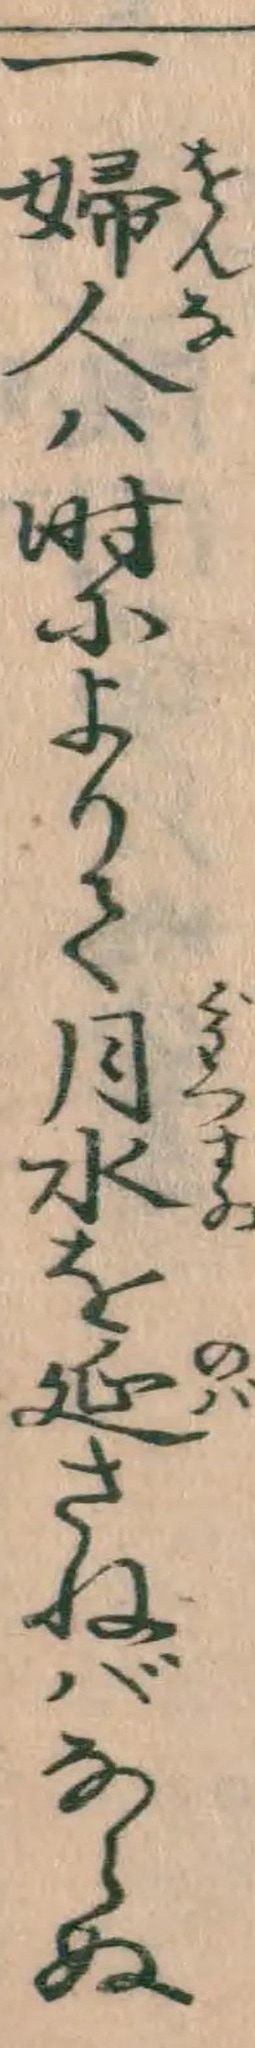一婦人は時によりて月水を延さねばならぬ
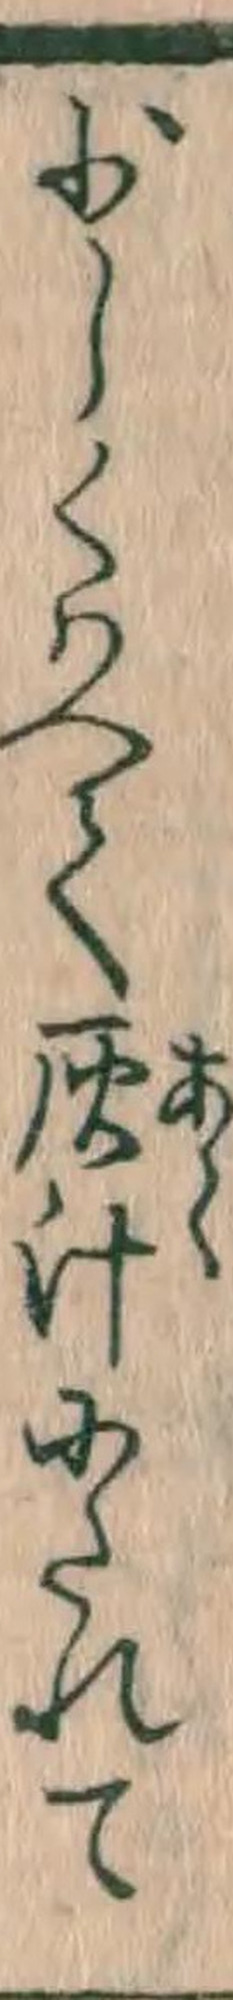少しくはへて灰汁にたれて
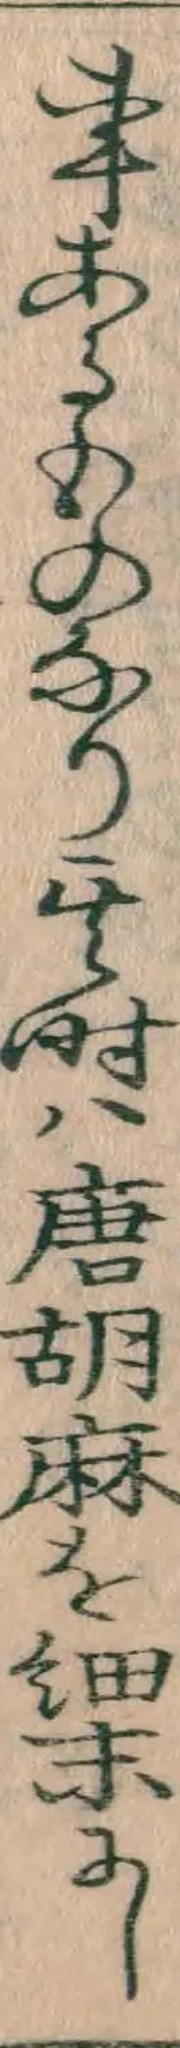事あるものなり其時は唐胡麻を細末にし
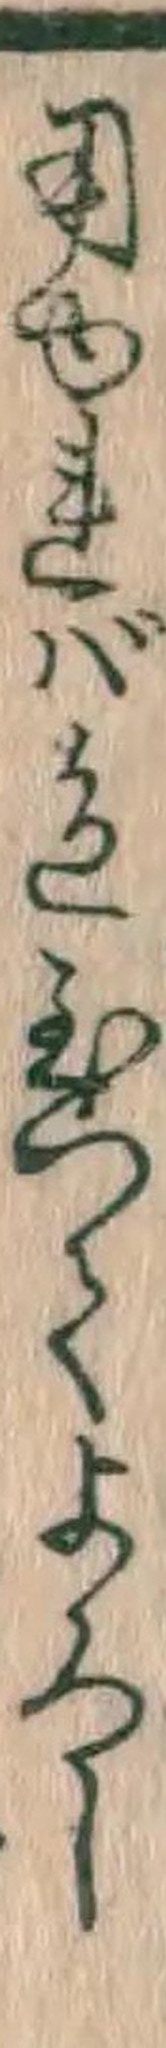用ゆれば色至つてよろし
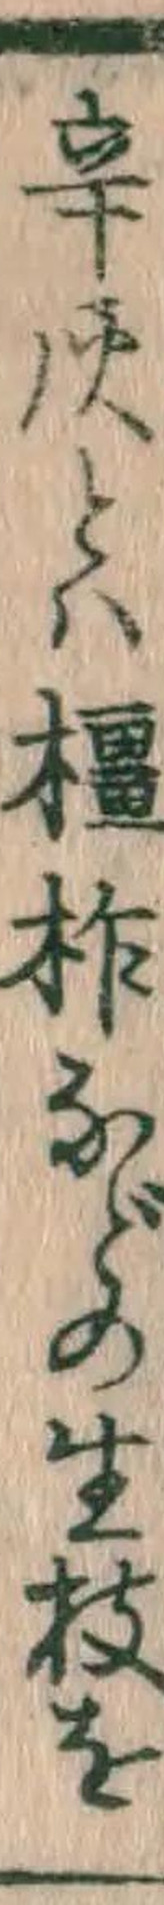辛灰とは橿柞などの生枝を
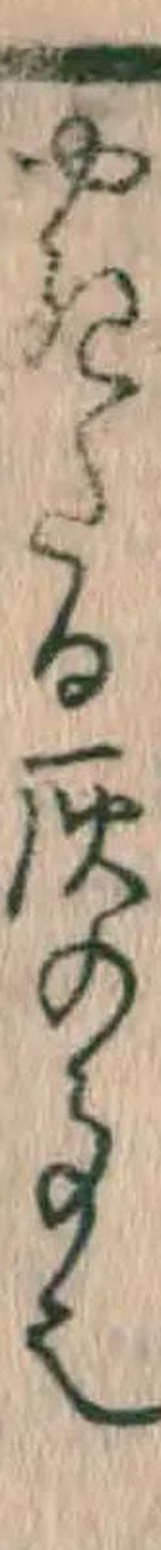やきたる灰の事也
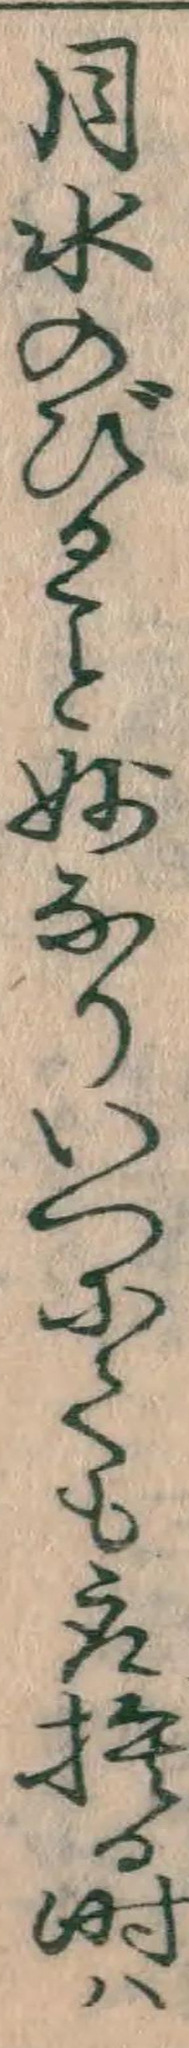月水のびること妙なりいつにても取捨る時は
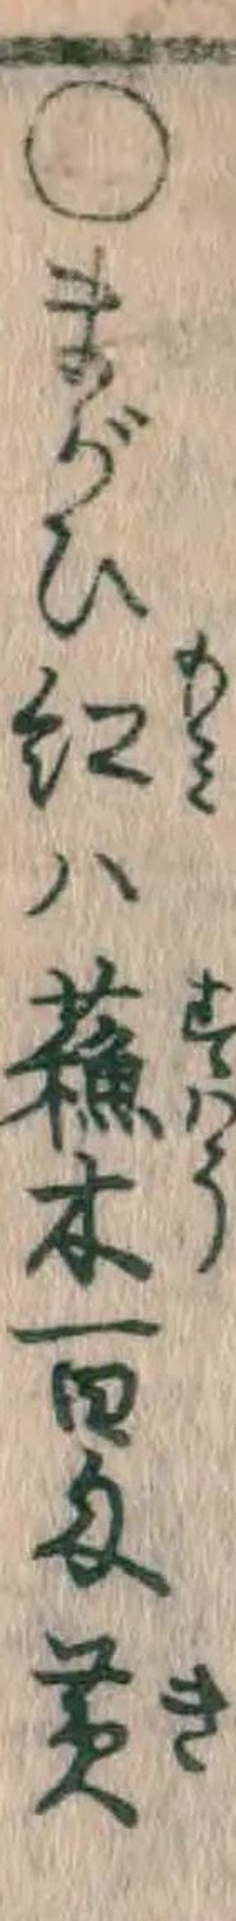○まがひ紅は蘓木一匁黄
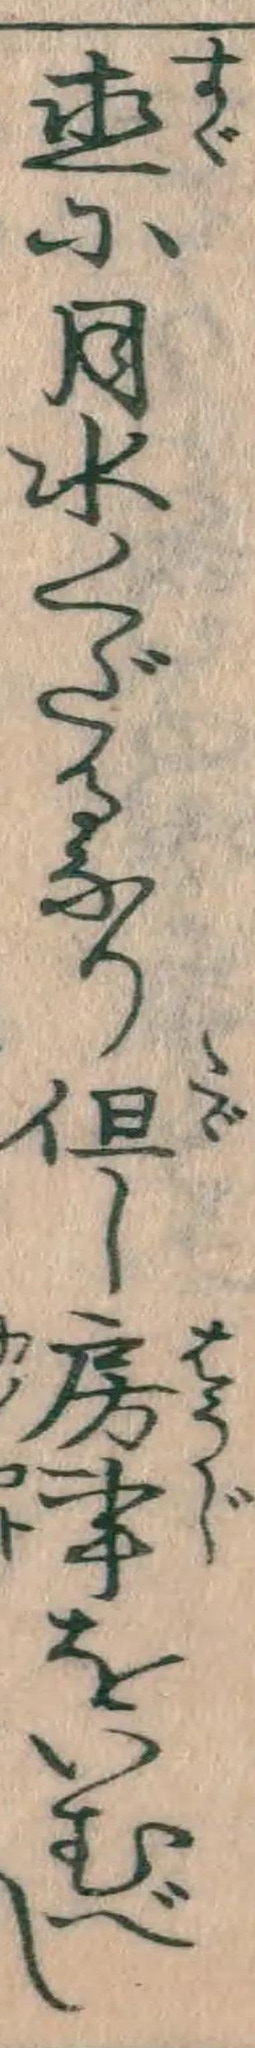直に月水くだるなり但し房事をいむべし
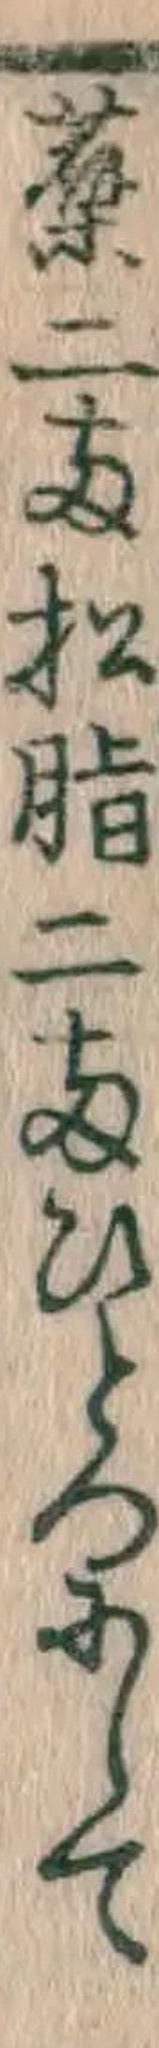蘗二両松脂二両ひとつにして
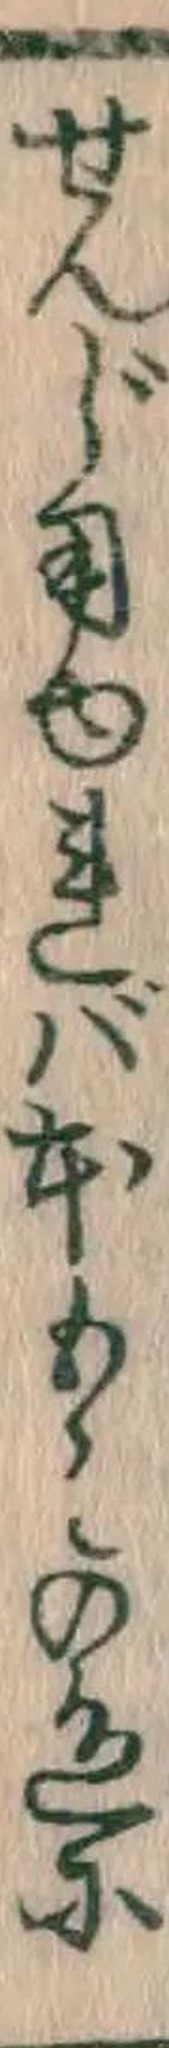せんじ用ゆれば本もの色に
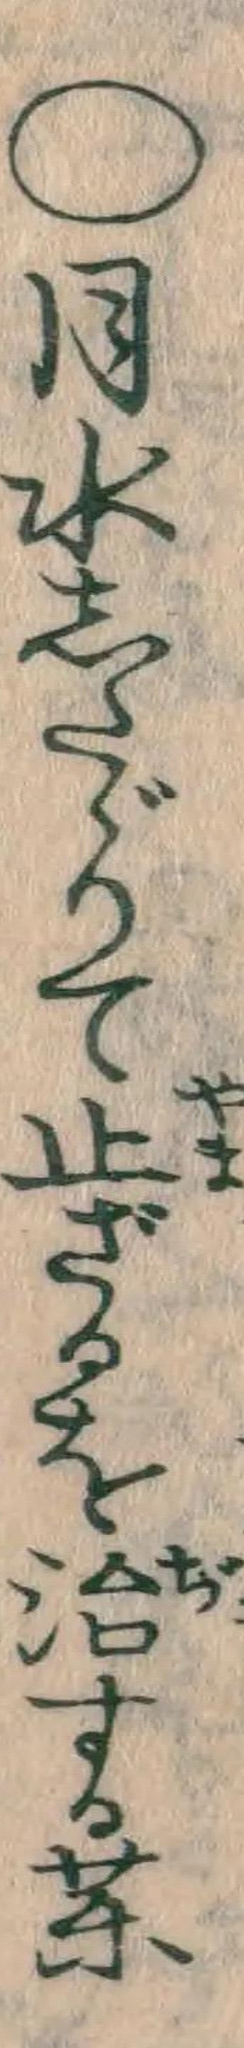○月水したゞりて止ざるを治する薬
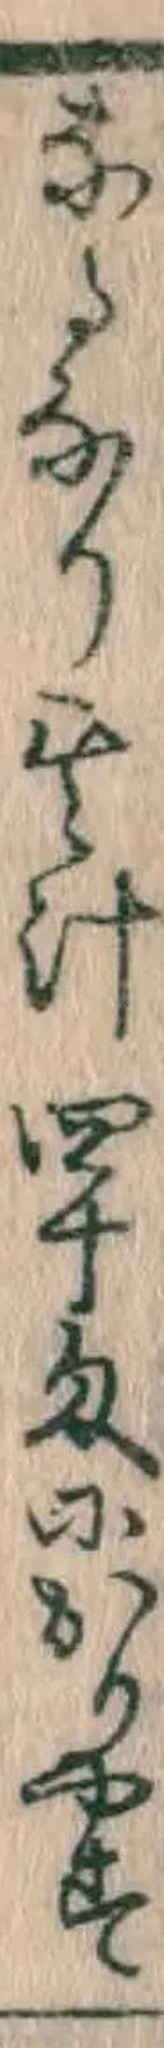なるなり其汁四十匁にかりやす
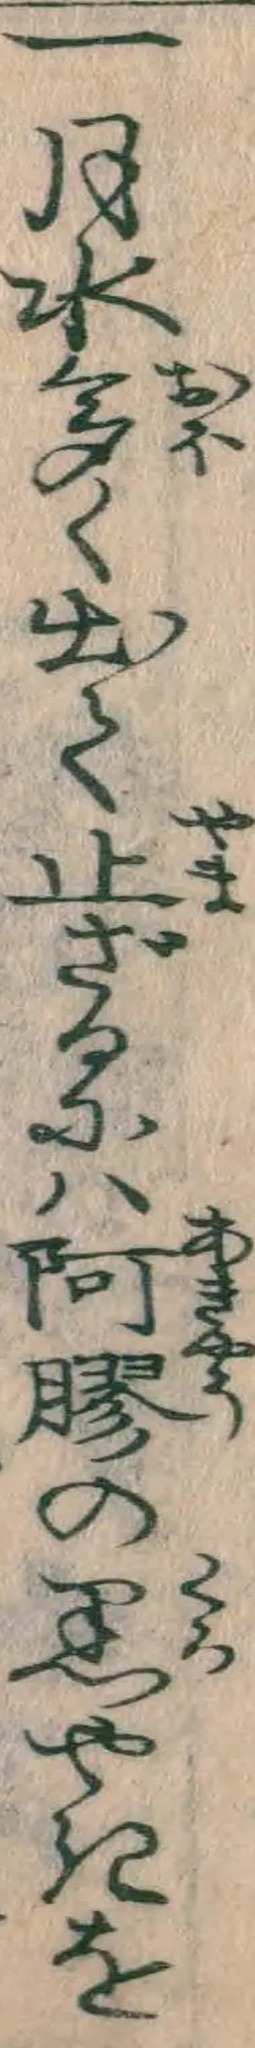一月水多く出て止ざるには阿膠の黒やきを
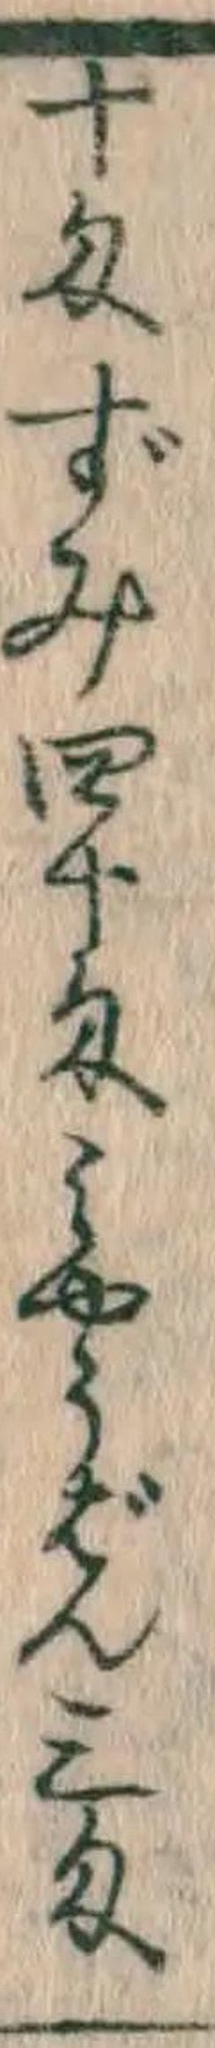十匁ずみ四十匁みやうばん三匁
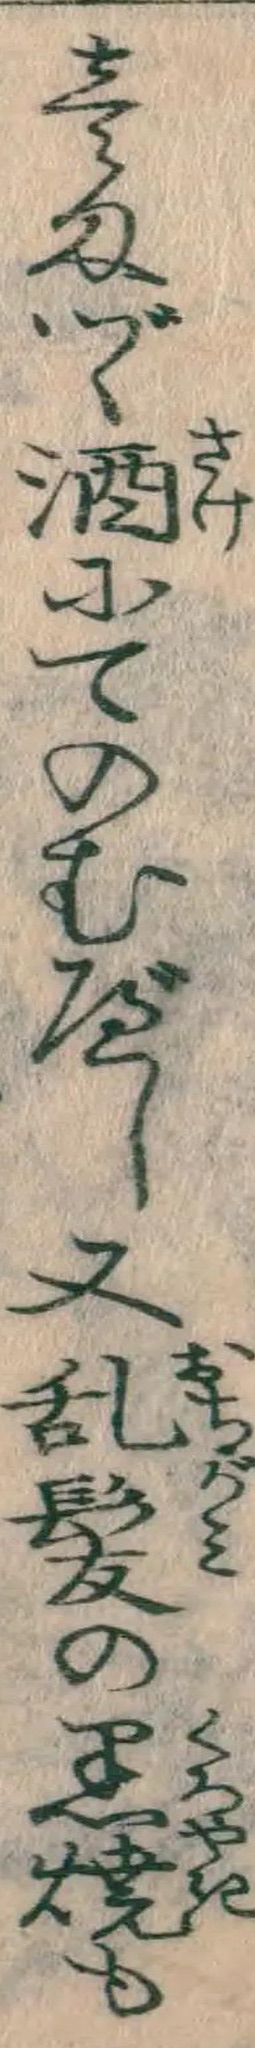壱匁づゝ酒にてのむべし又乱髪の黒焼も
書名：広益秘事大全 3巻. [3]
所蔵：国立国会図書館 National Diet Library, JAPAN
